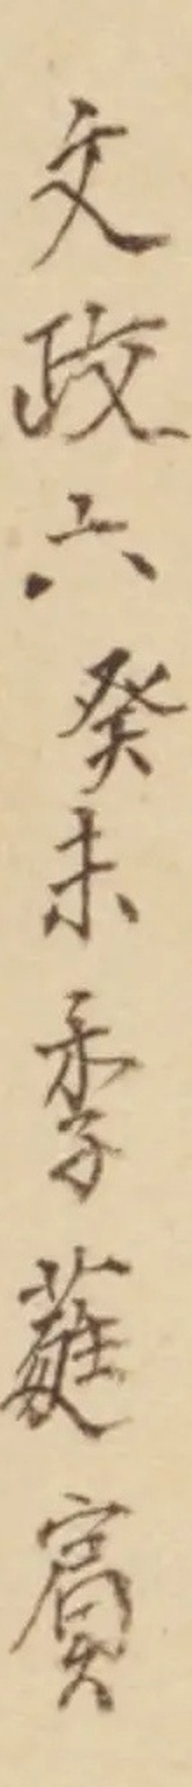文政六癸未未季蕤賓

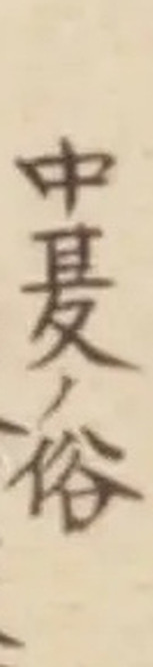中夏ノ俗
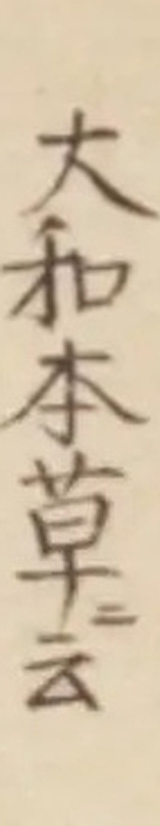大和本草ニ云
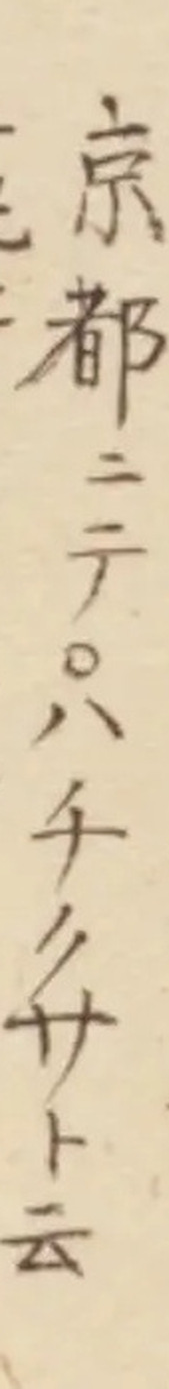京都ニテ○ハチクサト云
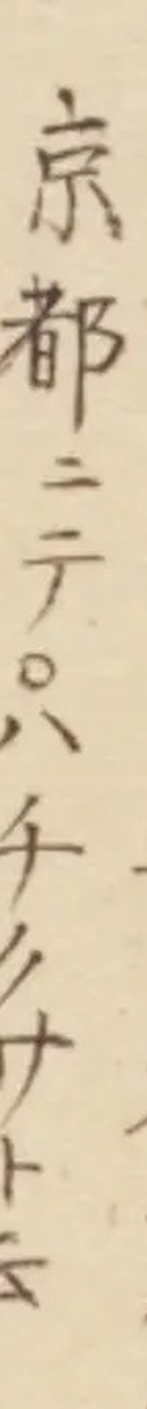京都ニテ○ハチクサト云
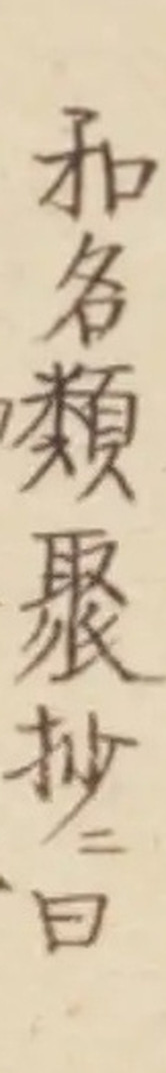和名類聚抄ニ曰
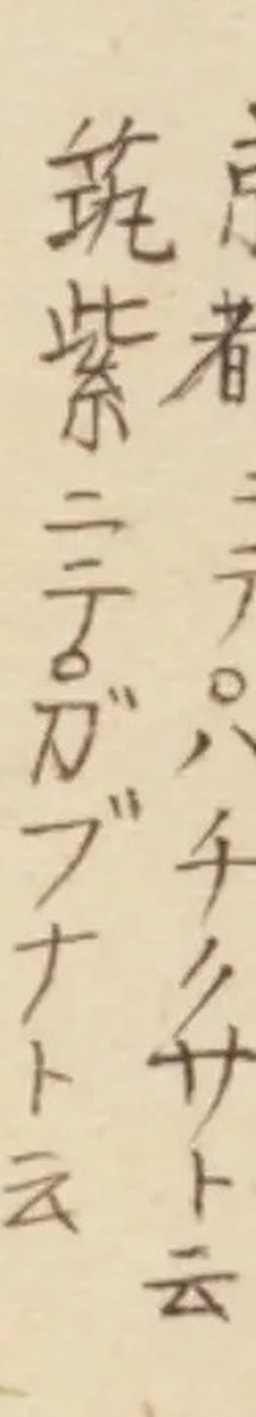筑紫ニテ○ガブナト云
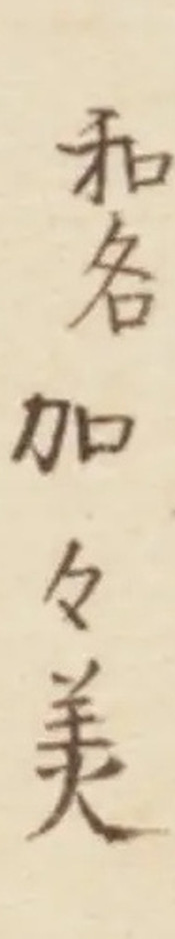和名加々美
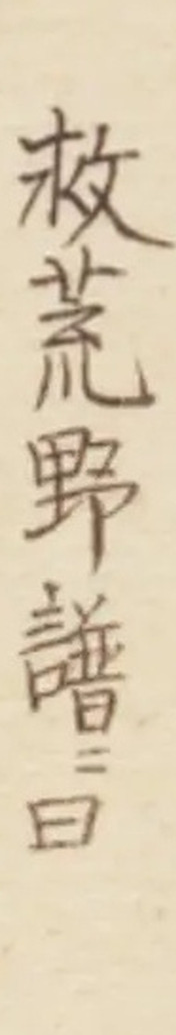救荒野譜ニ曰
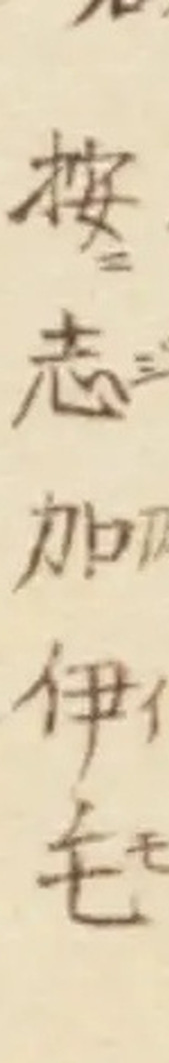名按ニ志加伊毛
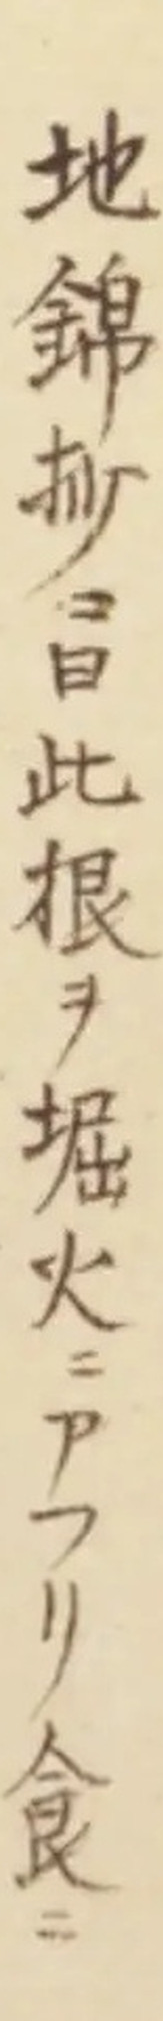地錦抄曰此根ヲ掘火ニアフリ食ニ
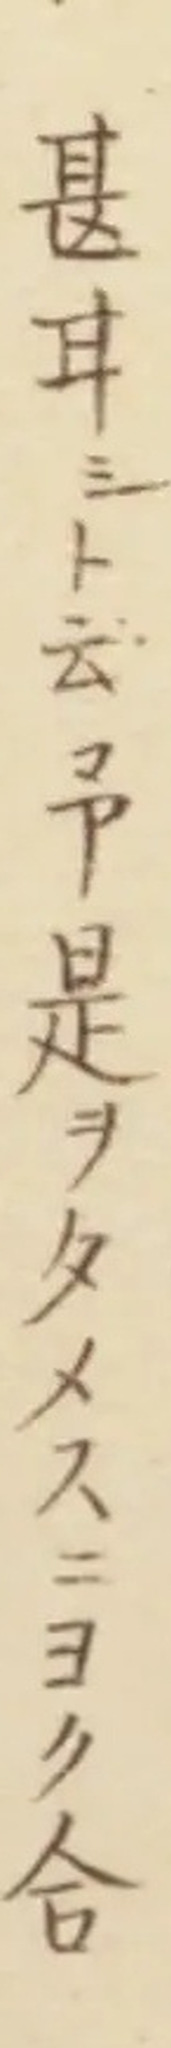甚甘シト云予是ヲタメスニヨク合
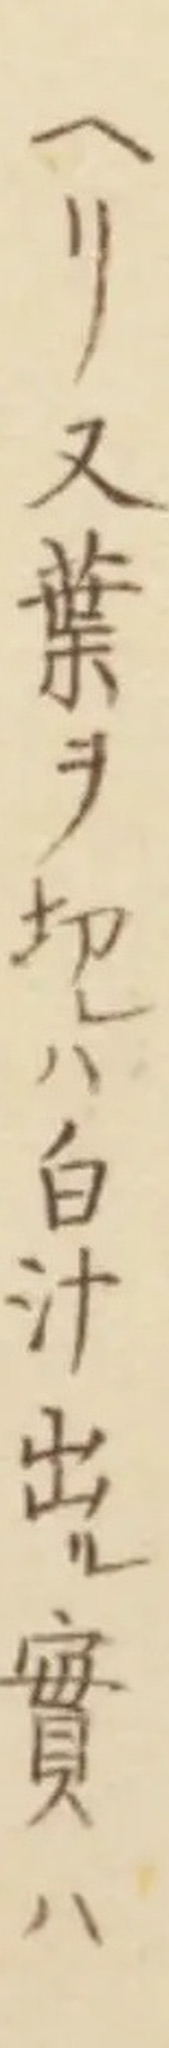ヘリ又葉ヲ切レハ白汁出ル實ハ
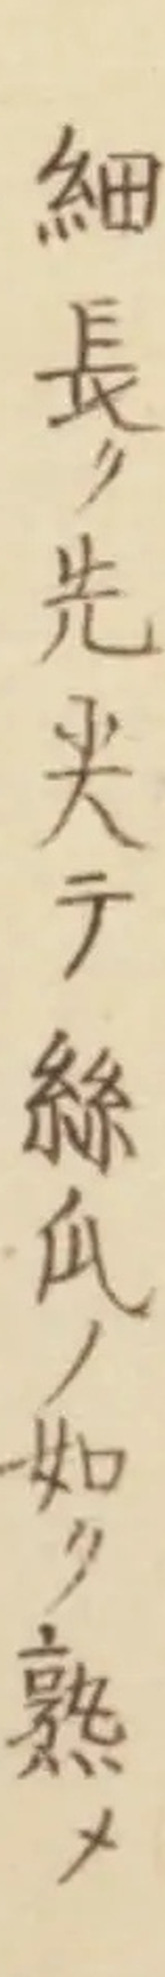細長ク先尖テ絲瓜ノ如ク熟メ
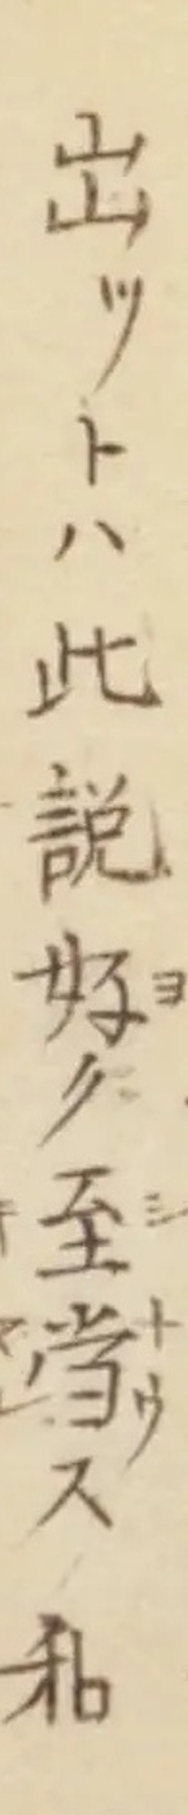出ツトハ此説好ク至當ス和
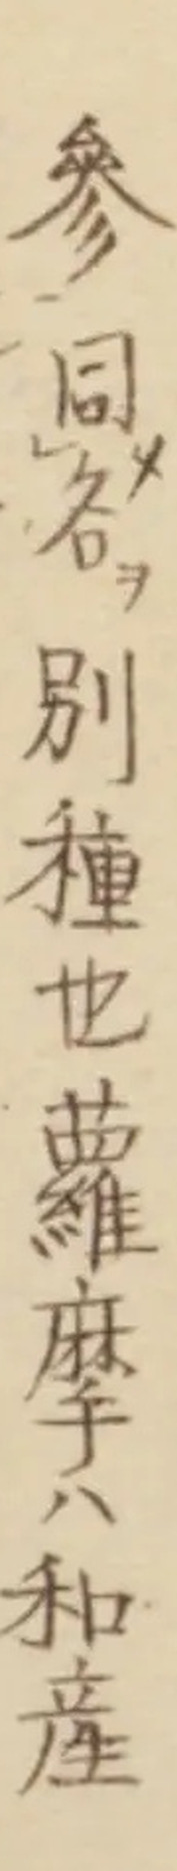参同メ名を別種也蘿摩ハ和産ノ
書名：梅園草木花譜夏之部. 2
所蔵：国立国会図書館 National Diet Library, JAPAN
